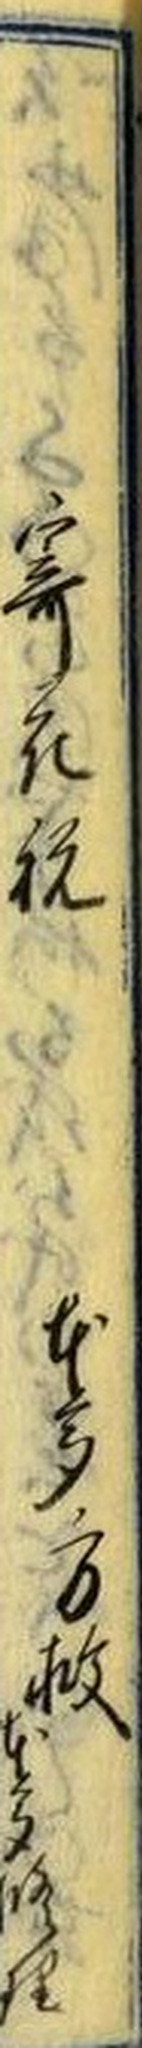寄花祝本多方救本多修理
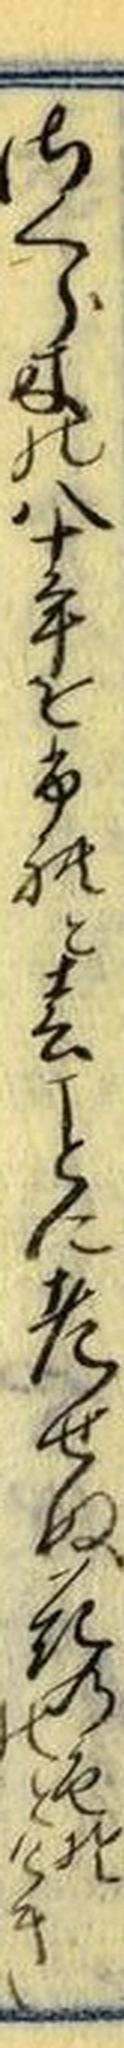さくら木の八十年をふれと春ことに老せぬ花の色そのとけき
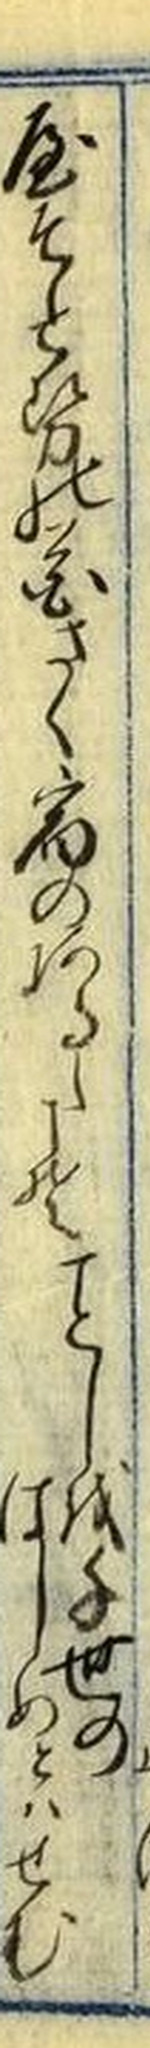やそとせの花さく宿のあるしこそことしを千世のはしめとはせむ
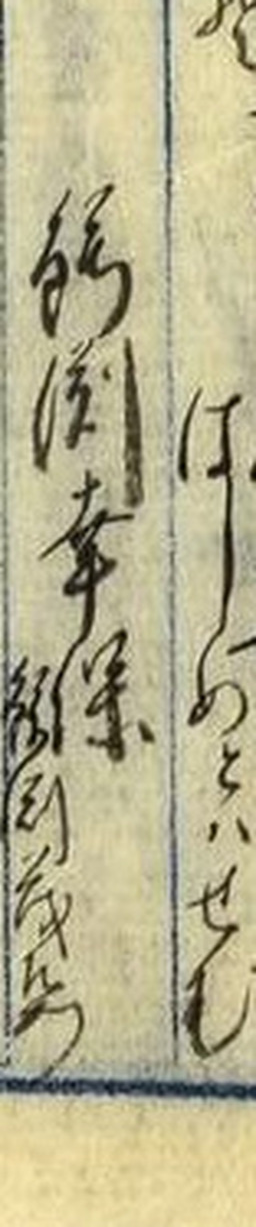鰐渕幸保鰐渕茂左衛門
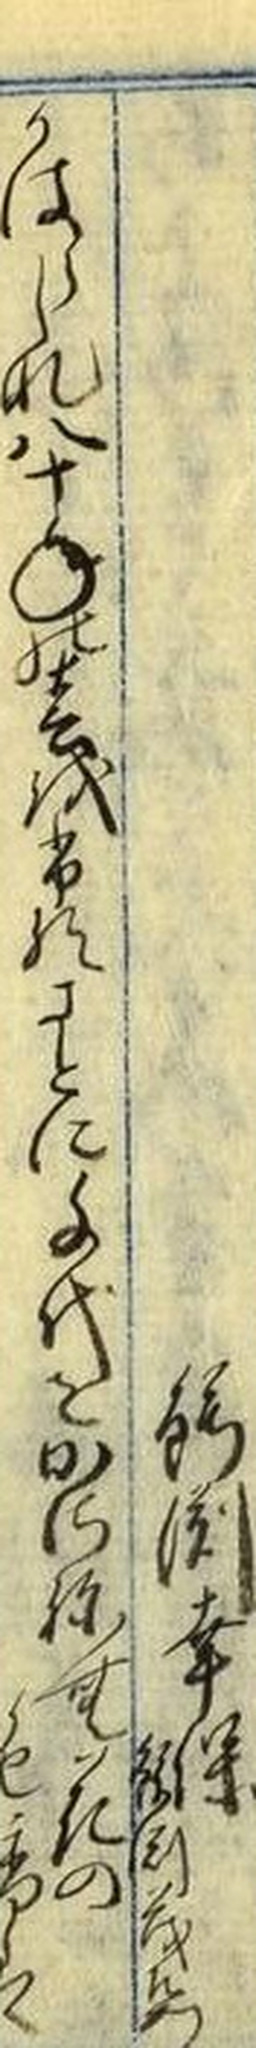かはらしな八十年の春をふることに千代をかさねむ花の色香は
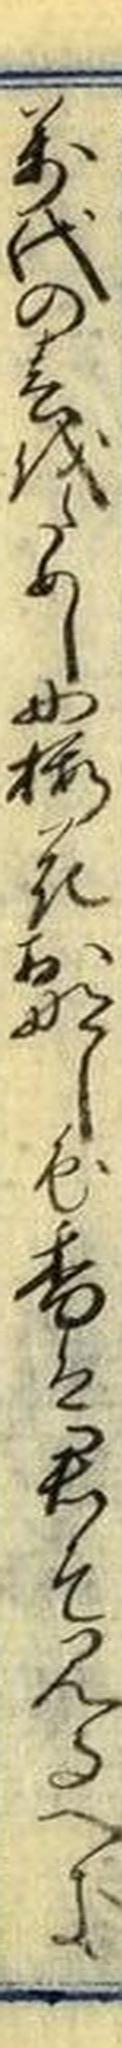萬代の春をためしに桜花おなし色香は君そ見るへき
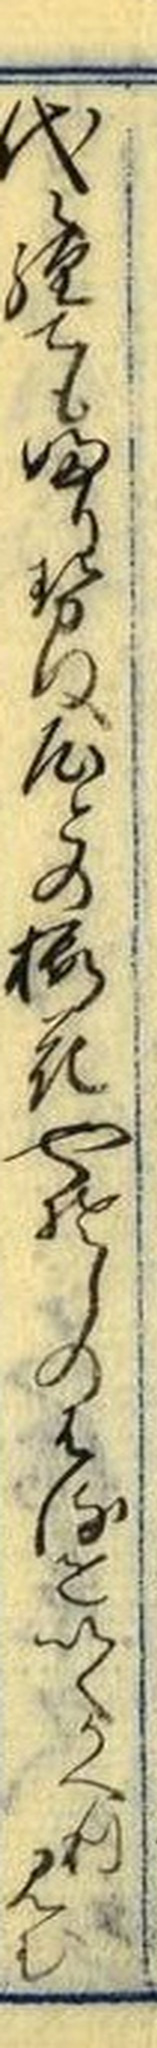代々へてもふりせぬやとの桜花やそしのはるをいくかへり見む

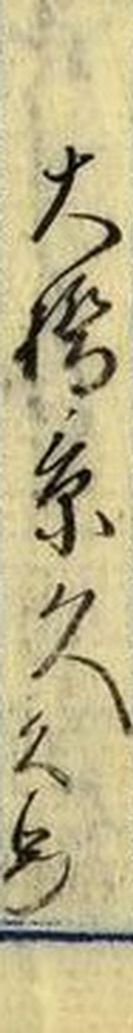大橋景久久右衛門
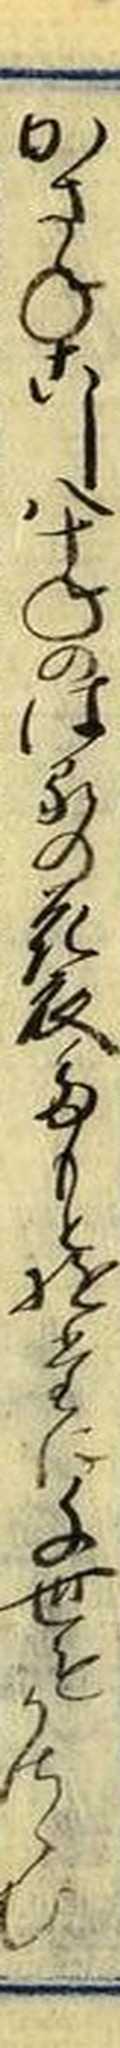かさねこし八十年のはるの花衣たもとゆたに千世をかさゝむ
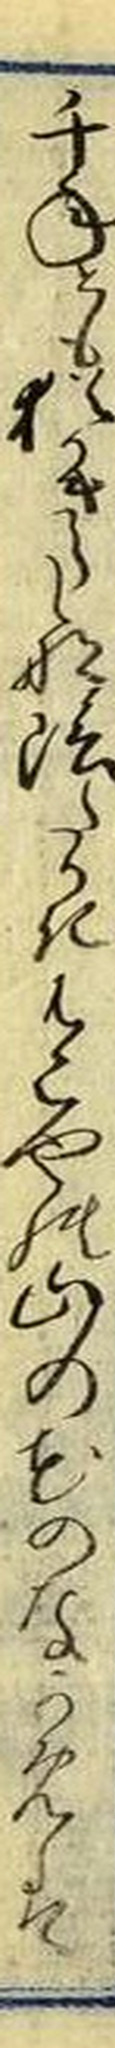千年とも猶かきらしな陰たかきはこやの山の花のなかめは
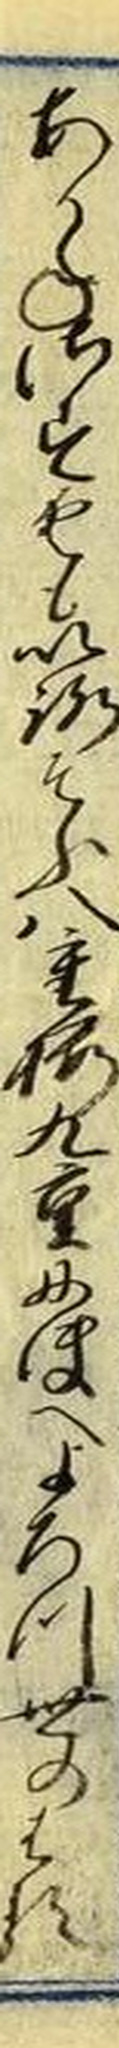あかねさす空もいろそふ八重桜九重にほへよろつ世のはる
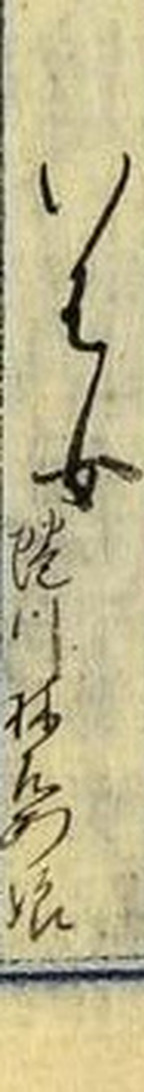いわ女蜷川林左衛門娘
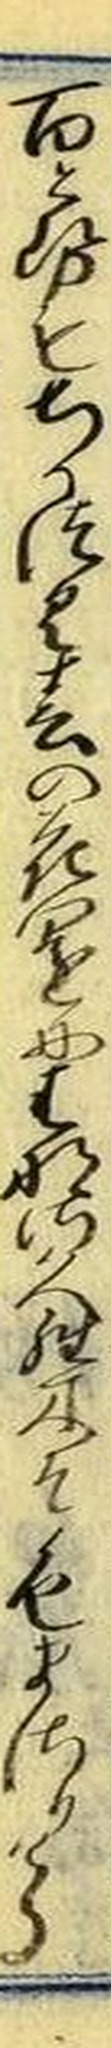百とせもちかつく春の花園にはなさくら木そ色まさりける
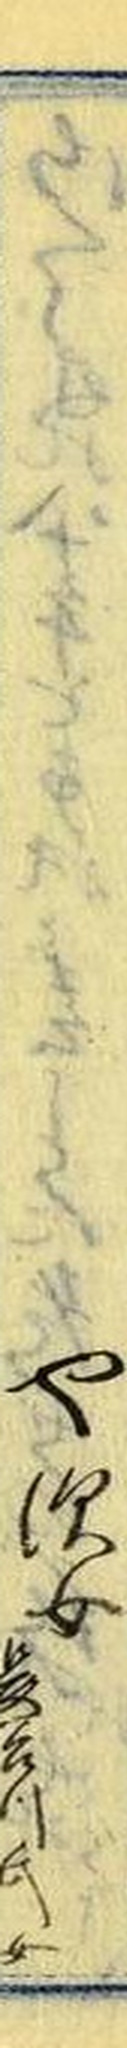やす女長谷川氏女
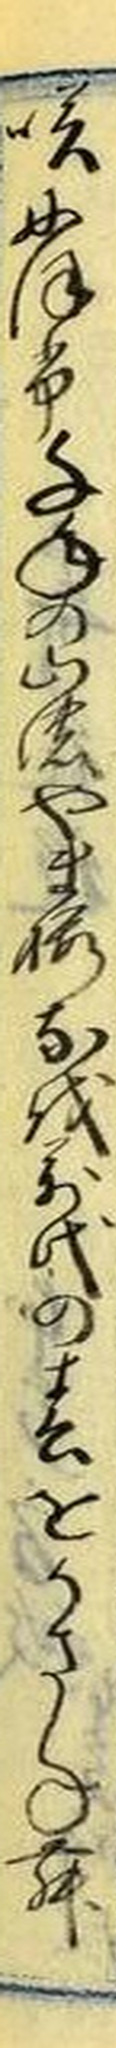咲にほふ千年の山のやま桜なを萬代の春をかさねむ
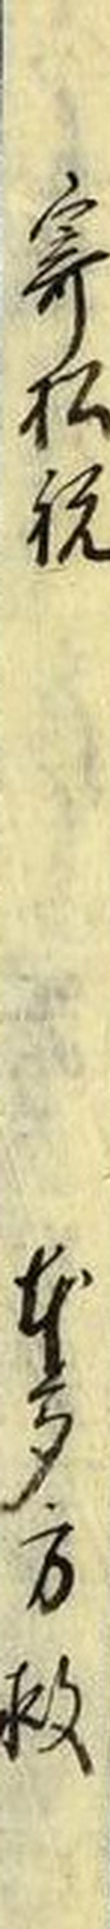寄松祝本多方救
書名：温古集 三巻
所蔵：福井県文書館 Fukui Prefectural Archives
